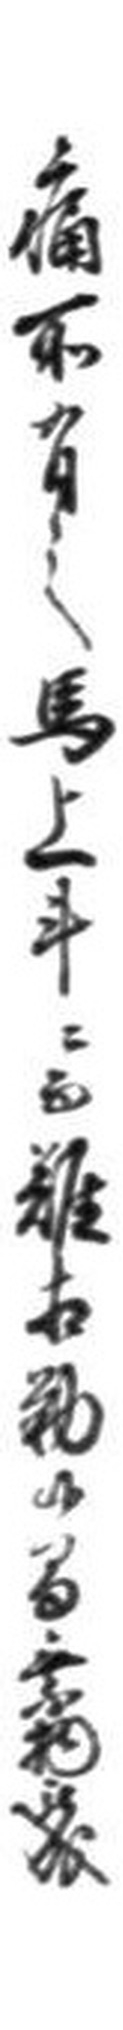痛所有之馬上斗ニ而難相勤候間乗物被成
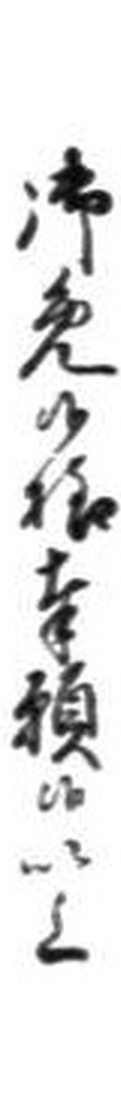御免候様奉願候以上
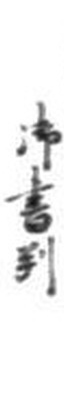御書判
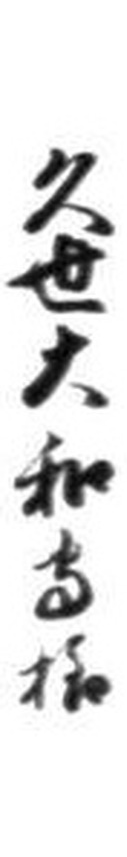久世大和守様

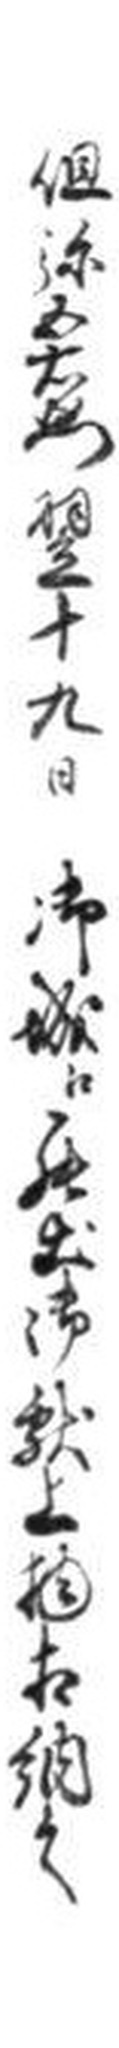但弥五右衛門翌十九日御城江罷出御献上物相納之
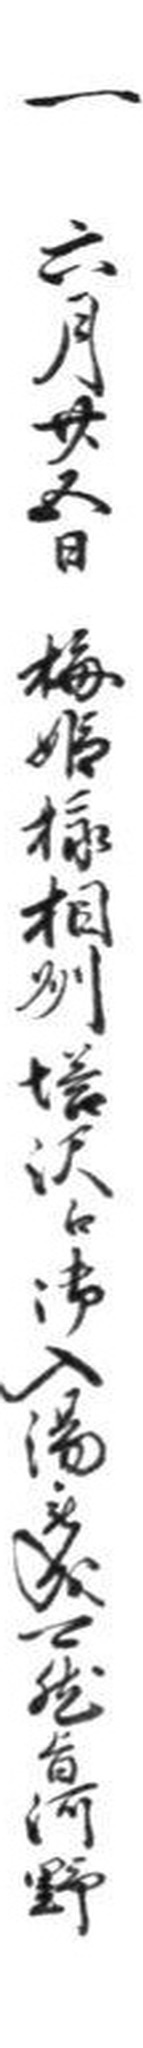一六月廿五日梅姫様相州塔沢江御入湯被成可然旨河野
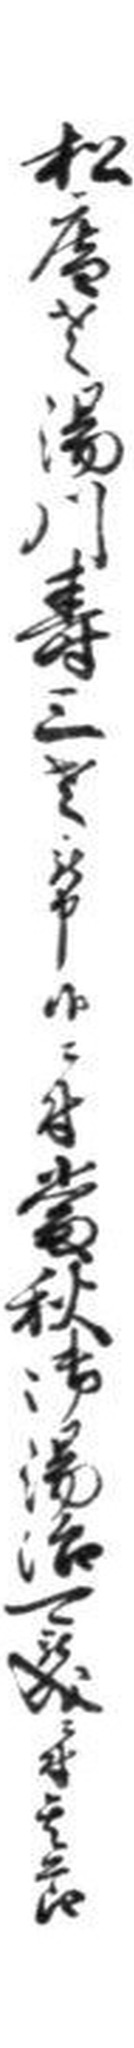松庵老湯川寿三老被申候ニ付当秋御湯治可被成ニ付其節
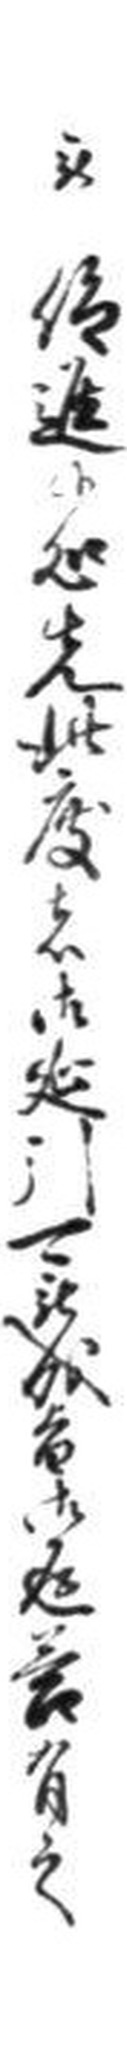被仰進候処先此度者御延引可被成旨御返答有之
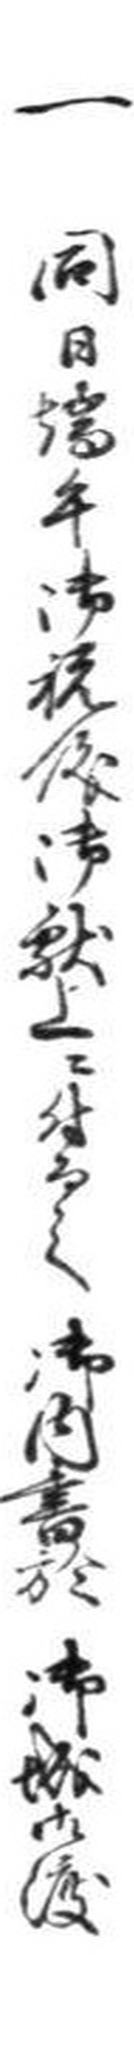一同日端午御祝儀御献上ニ付而之御内書於御城御渡
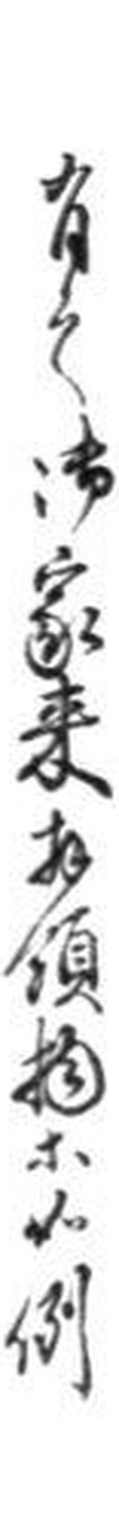有之御家来拝領物等如例
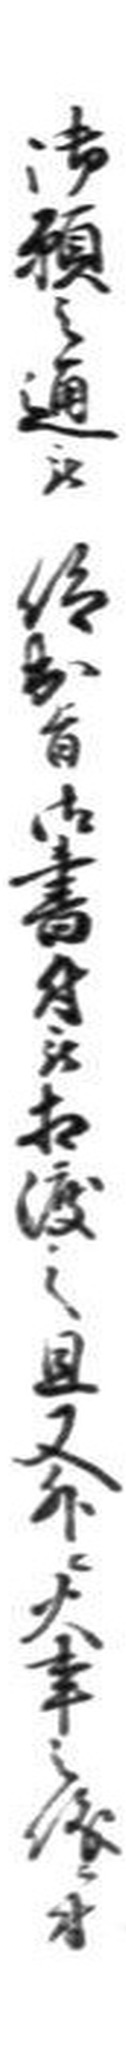御願之通被仰出旨御書付被相渡之且又外ニ火事之儀ニ付
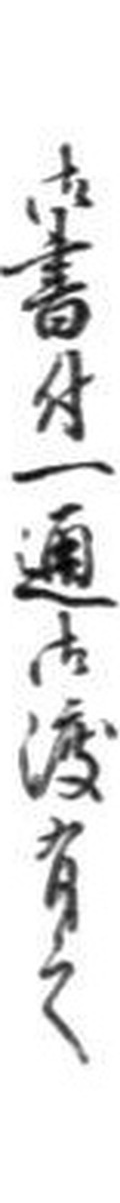御書付一通御渡有之
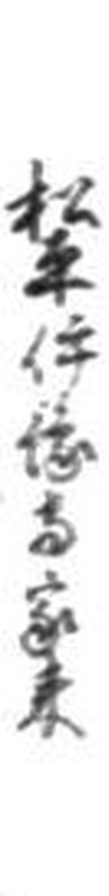松平伊予守家来
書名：家譜 三十三 吉邦公 享保四年
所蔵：福井県文書館 Fukui Prefectural Archives
